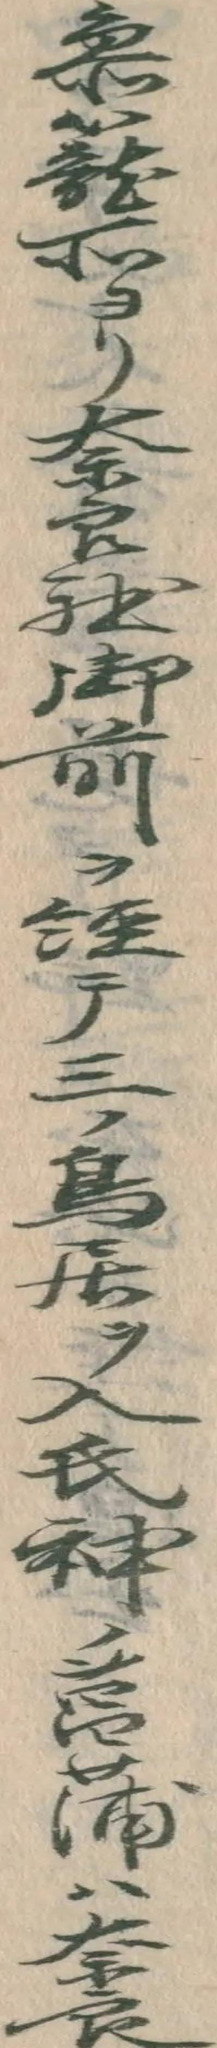参籠所ヨリ奈良社御前ヲ経テ三ノ鳥居ヲ入氏神ノ菖蒲ハ奈良
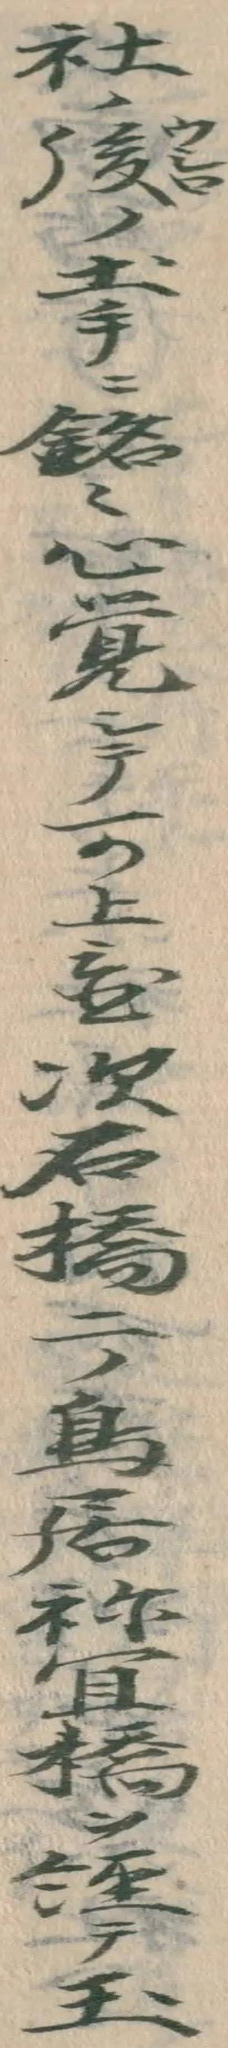社ノ後ノ土手ニ銘々心覚シテ可上置次石橋二ノ鳥居禰宜橋ヲ経テ玉
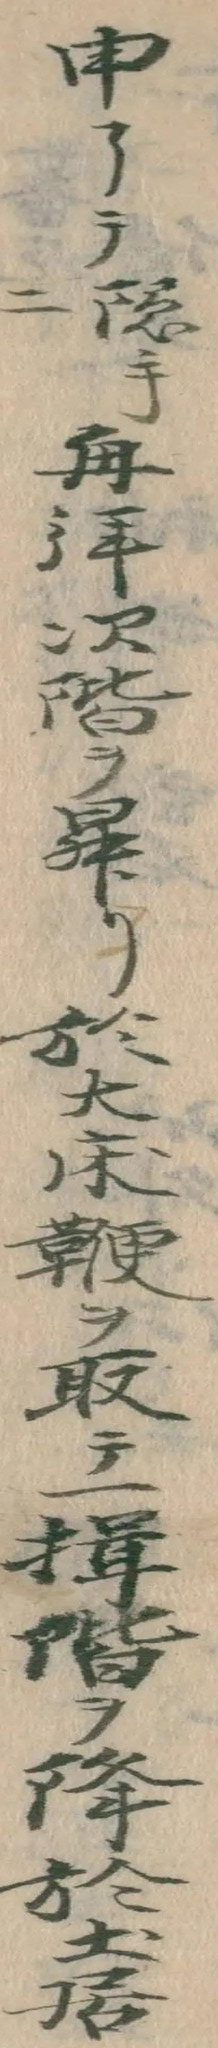申了テ隠手ニ再拝次階ヲ昇リ於大床鞭ヲ取テ一揖階ヲ降於土居
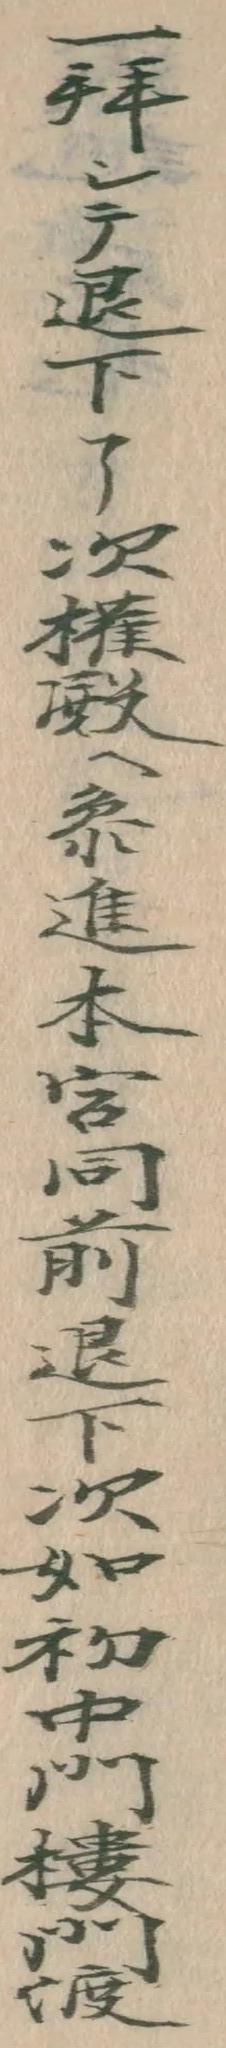一拝シテ退下了次権殿へ参進本宮同前退下次如初中門楼門渡
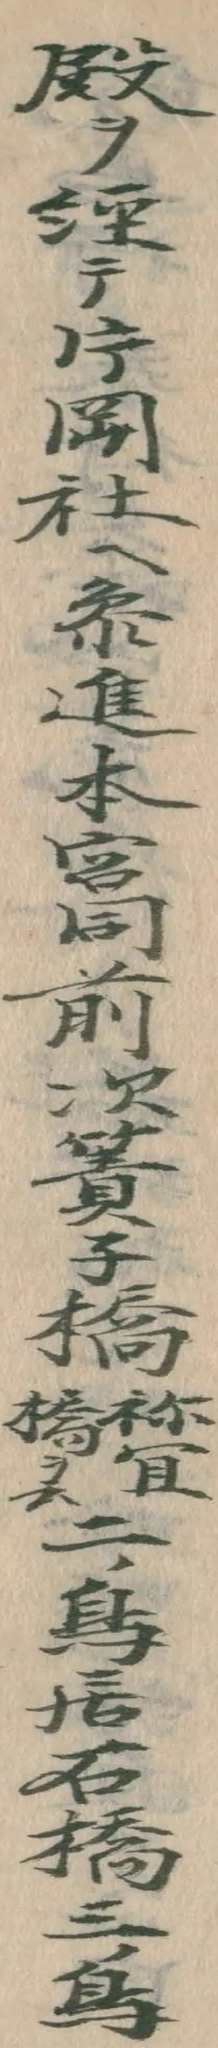殿ヲ経テ片岡社へ参進本宮同前次簀子橋禰宜橋ヲ云二ノ鳥居石橋三ノ鳥
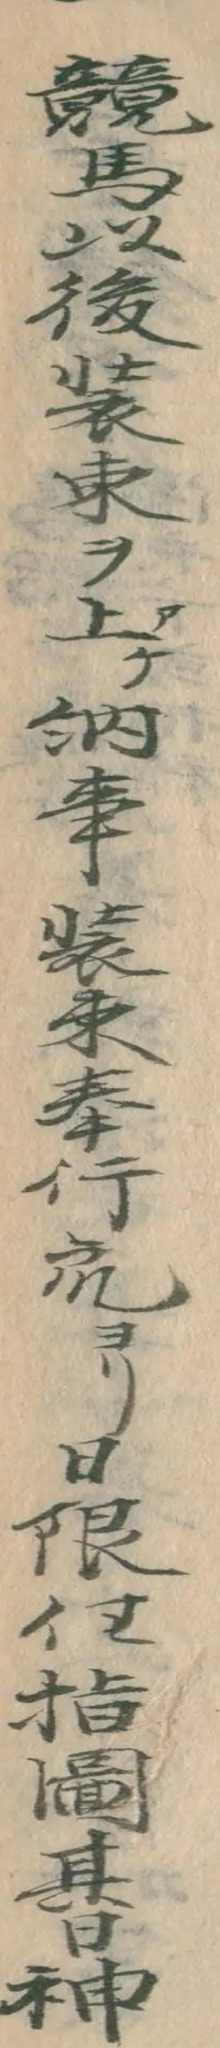一競馬以後装束ヲ上ケ納事装束奉行衆ヨリ日限任指図其日神

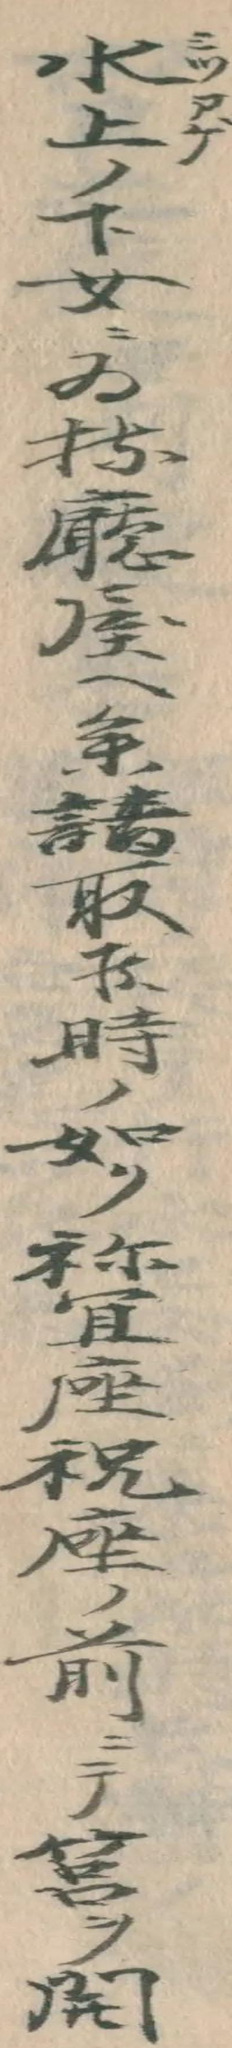水上ノ下女ニ為持庁屋へ参詣取持時ノ如ク禰宜座祝座ノ前ニテ筥ヲ開
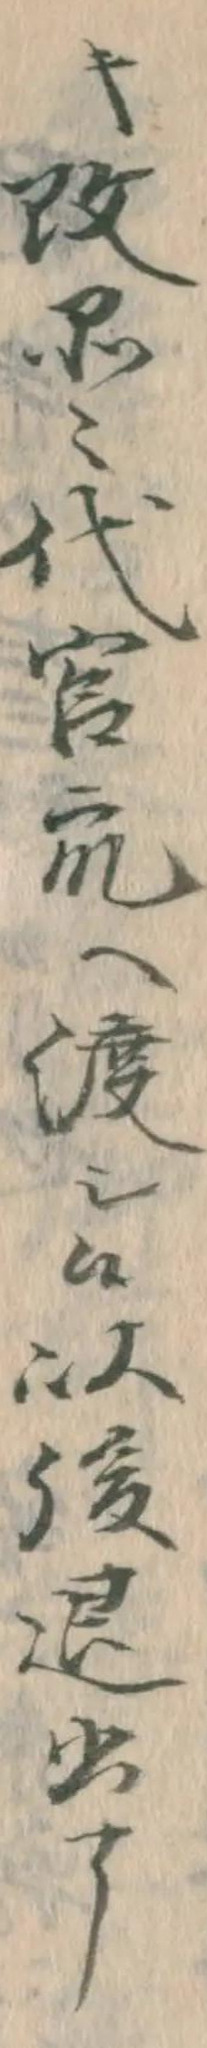キ改品々代官衆へ渡シ候以後退出了
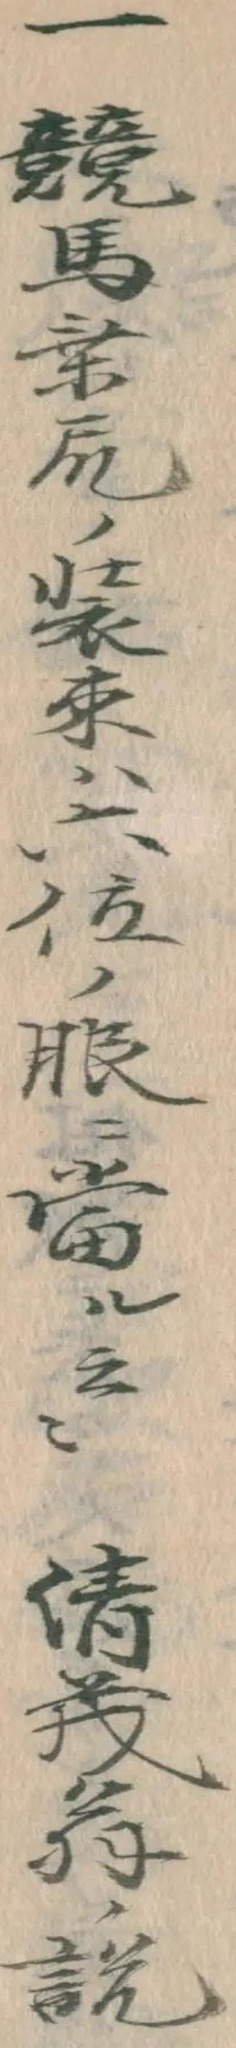一競馬乗尻ノ装束ハ六位ノ服ニ当ル云々清茂翁ノ説
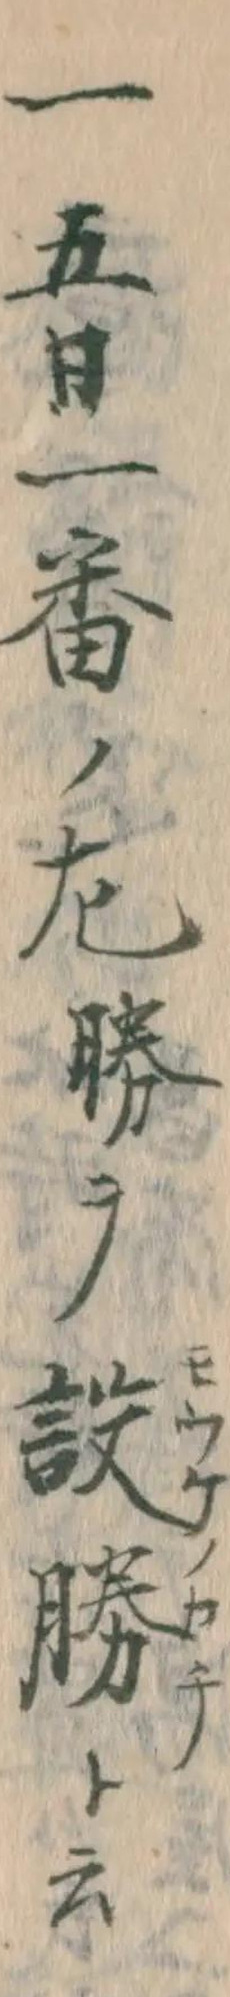一五日一番ノ左勝ヲ設勝ト云
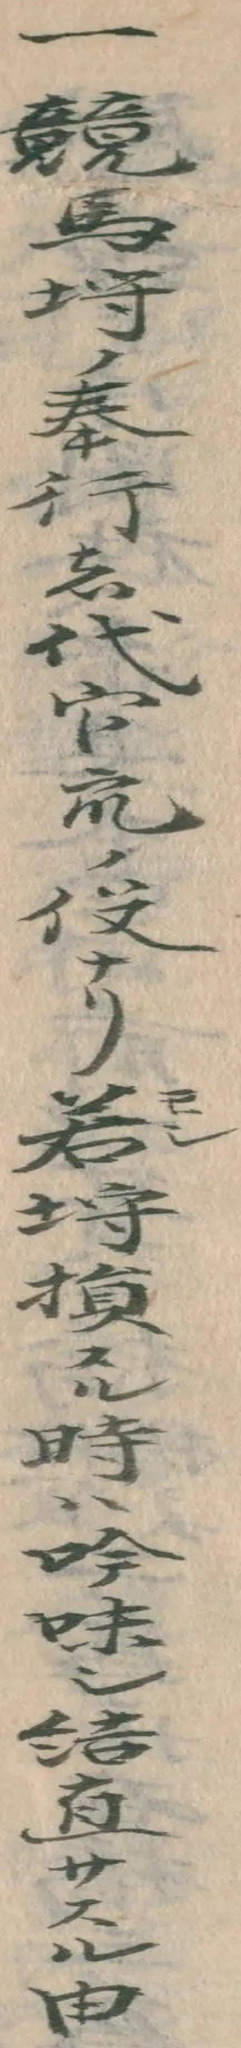一競馬埒ノ奉行者代官衆ノ役ナリ若埒損スル時ハ吟味シ結直サスル由
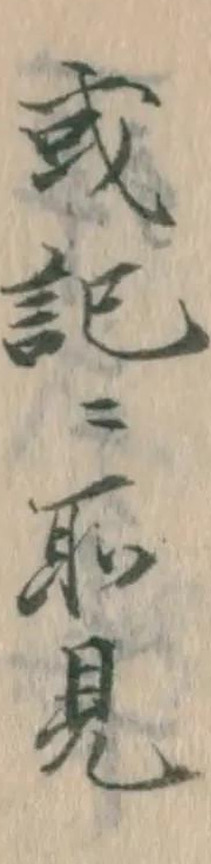或記ニ所見
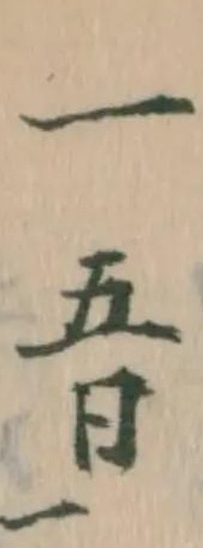一五日
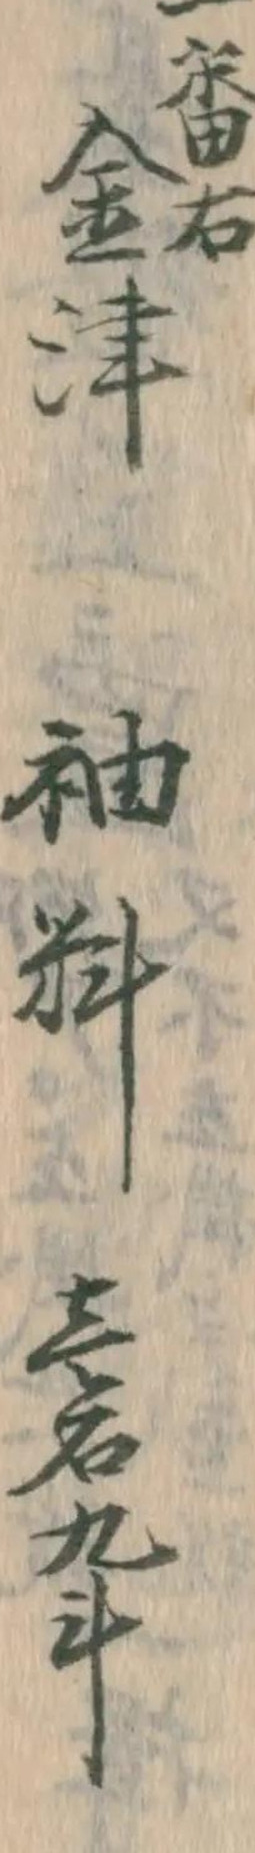金津袖料壱石九斗
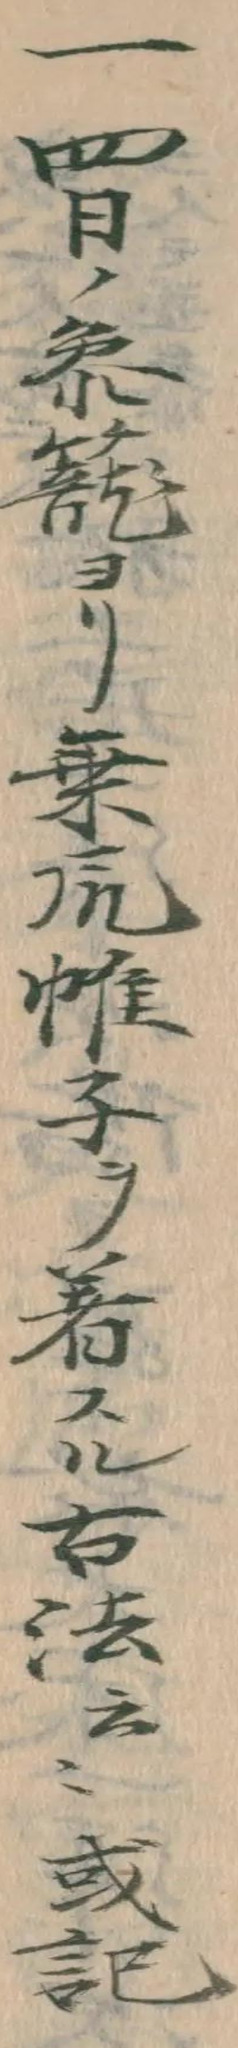一四日ノ参籠ヨリ乗尻帷子ヲ着スル古法云々或記
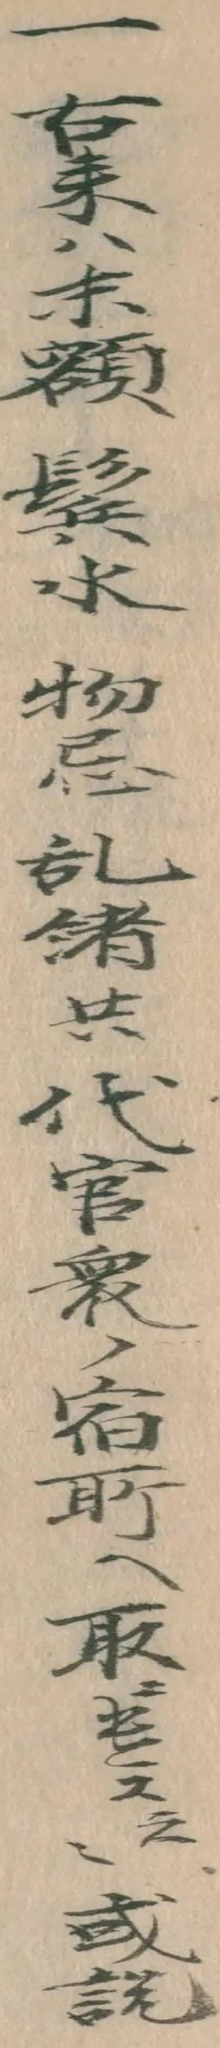一古来ハ末額鬂水物忌乱緒共代官衆ノ宿所へ取ニ遣ス云以或説
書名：賀茂社記録. 第11冊
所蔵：国立国会図書館 National Diet Library, JAPAN
